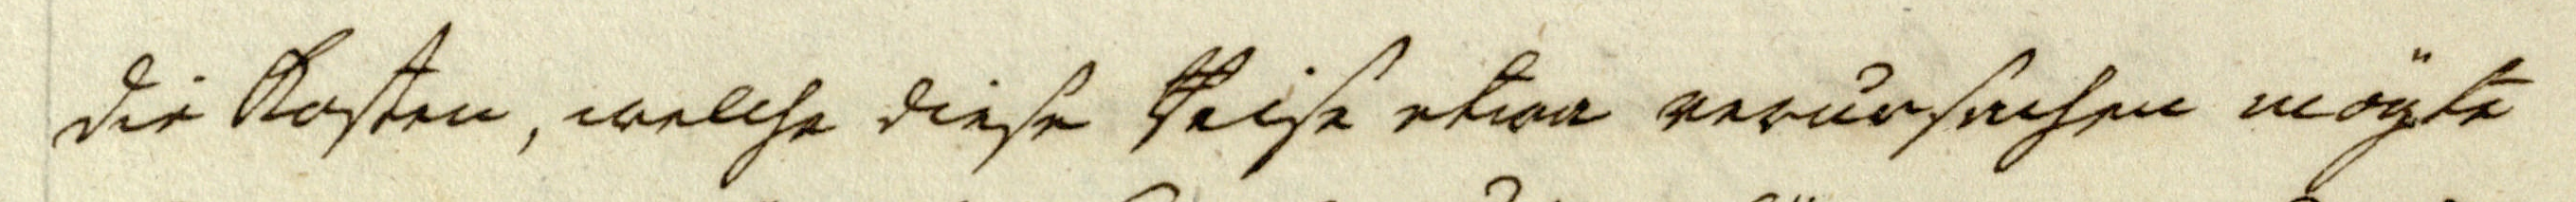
die Kosten, welche diese Reise etwa verursachen mögte
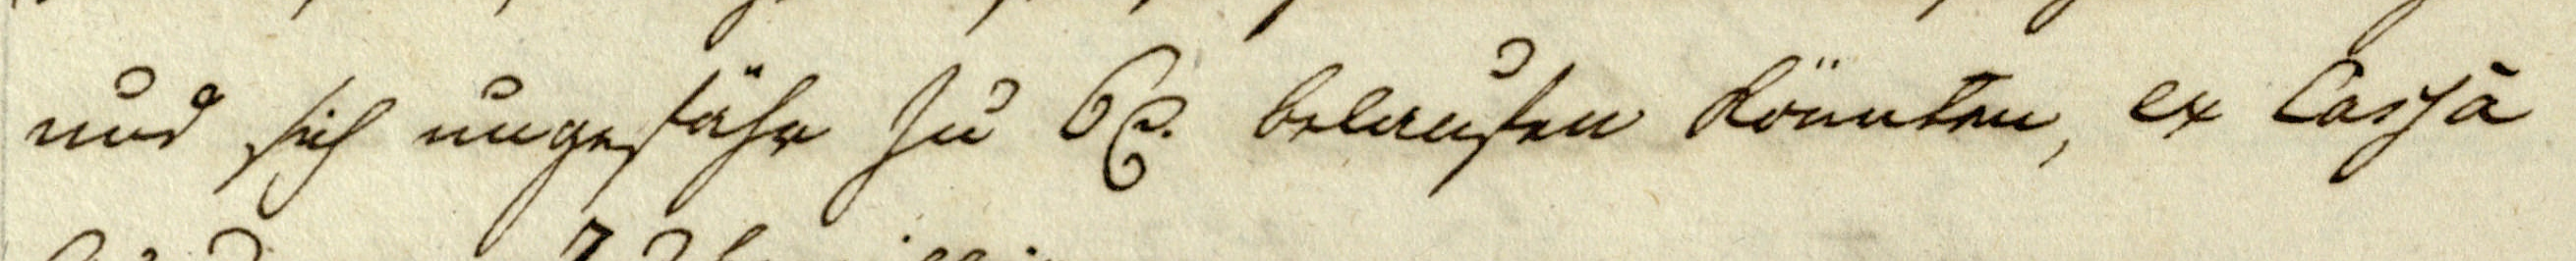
und sich ungefähr zu 6 l. belaufen könnten, ex Cassa
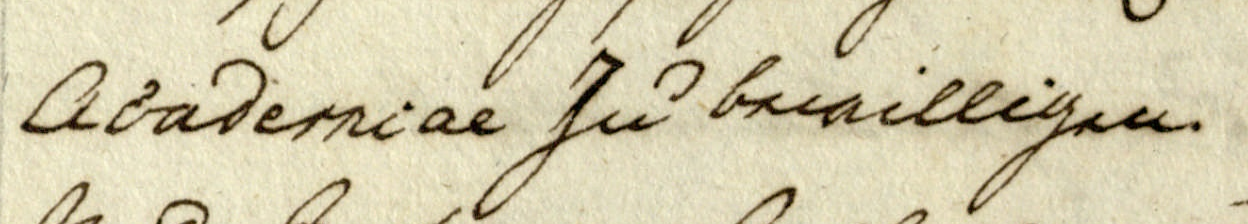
Academiae zu bewilligen.
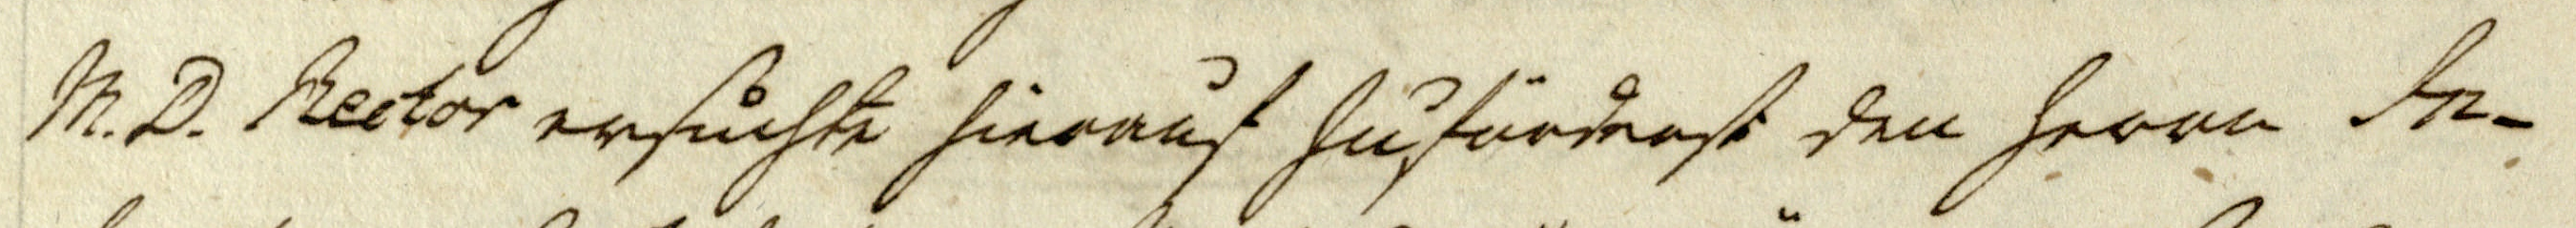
M. D. Rector ersuchte hierauf zuförderst den herrn In¬
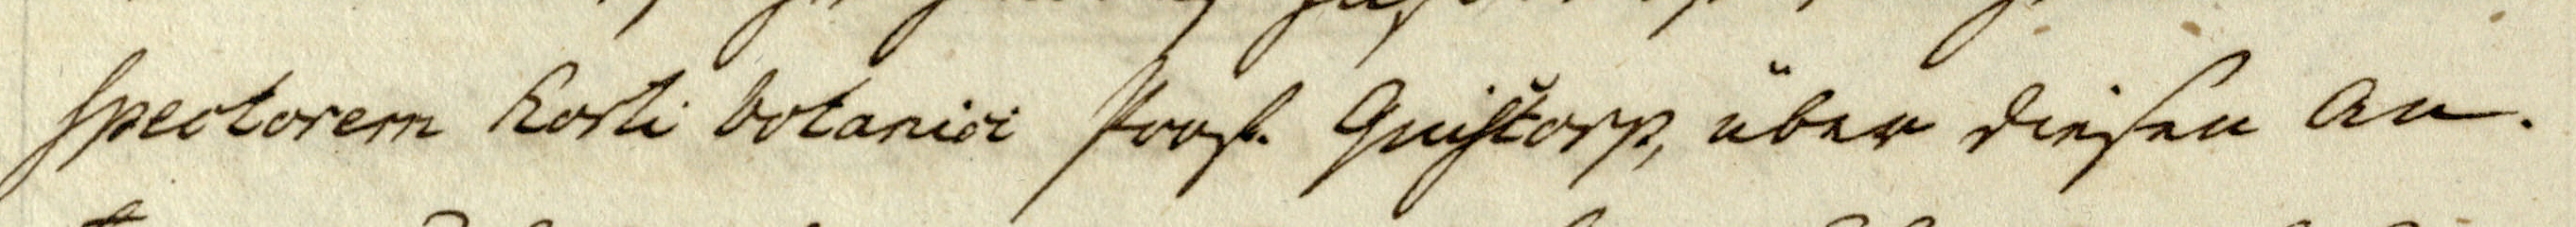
spectorem horti botanici Prof. Quistorp, über diesen An¬
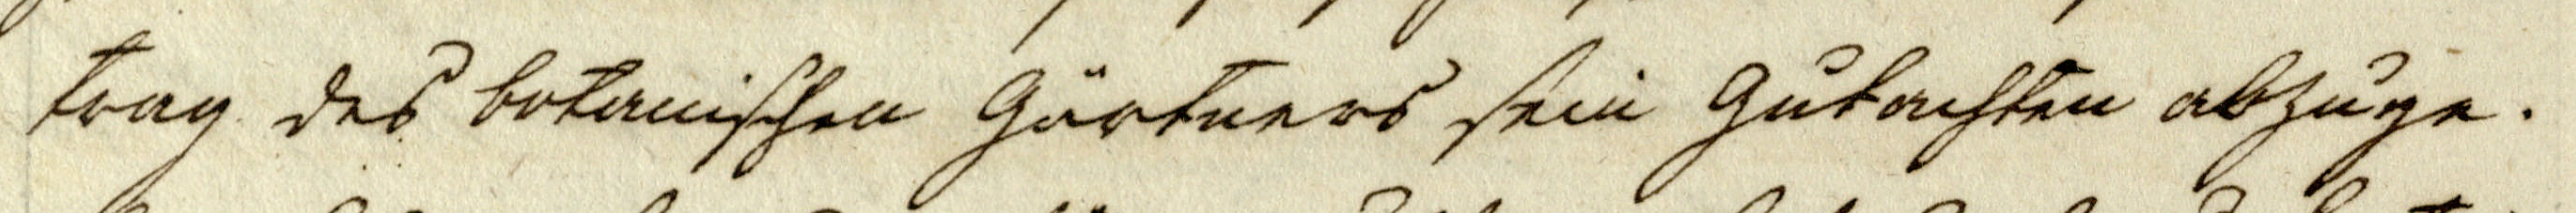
trag des botanischen Gärtners sein Gutachten abzuge¬
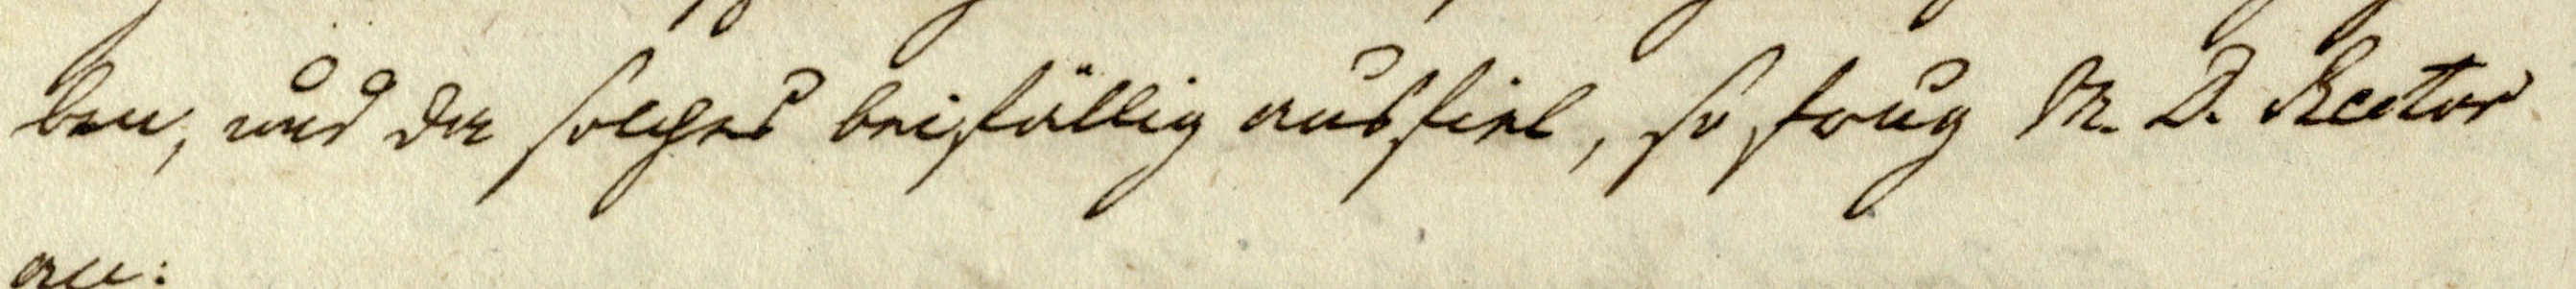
ben, und da solches beifällig ausfiel, so frug M. D. Rector
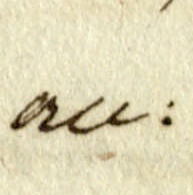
an:
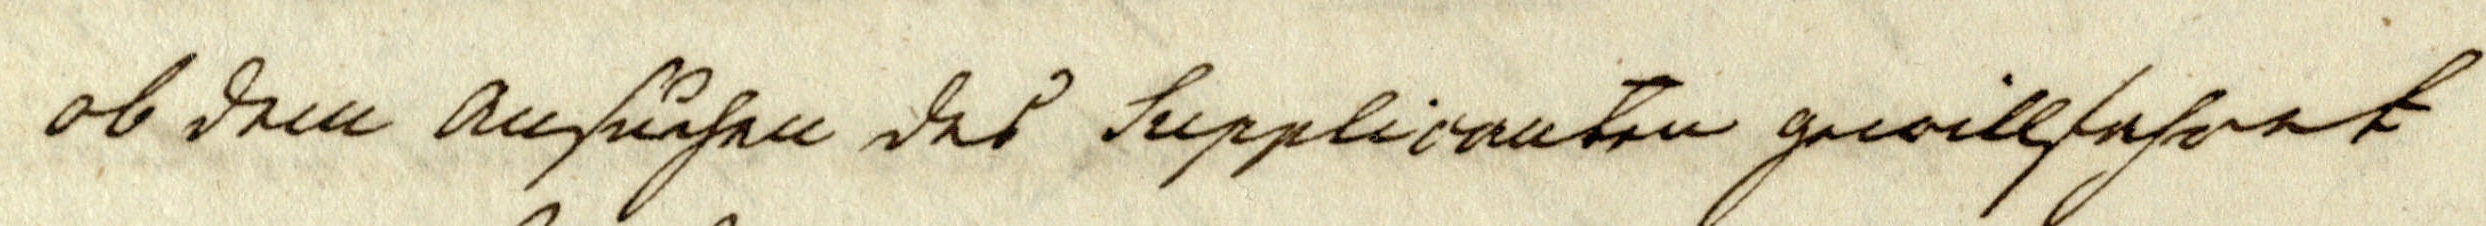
ob dem Ansuchen des Supplicanten gewillfahret
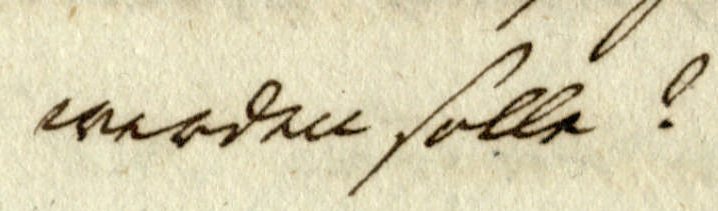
werden solle?
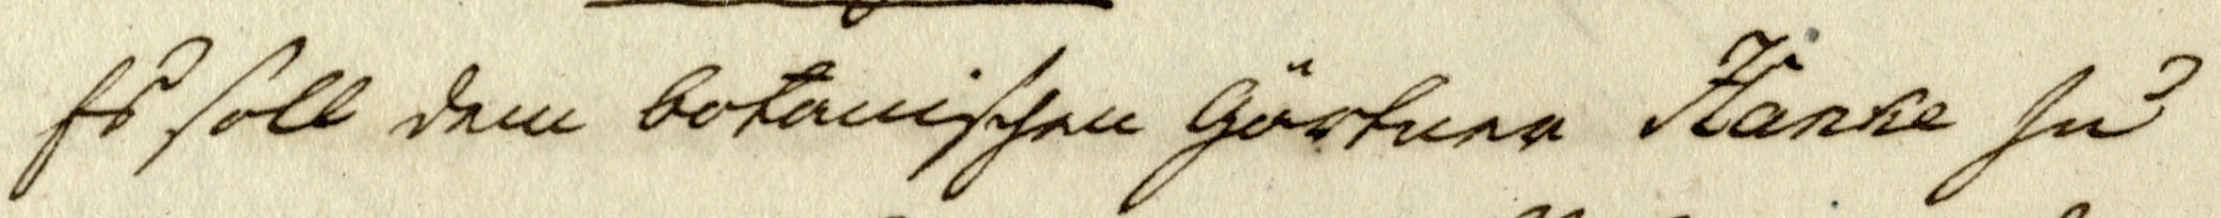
Es soll dem botanischen Gärtner Hanke zu
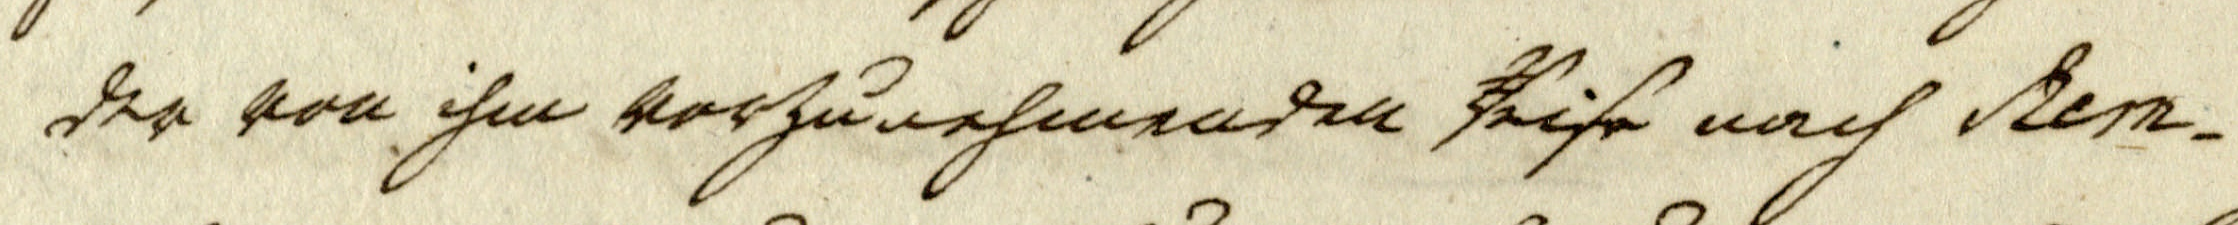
der von ihm vorzunehmenden Reise nach Rem¬
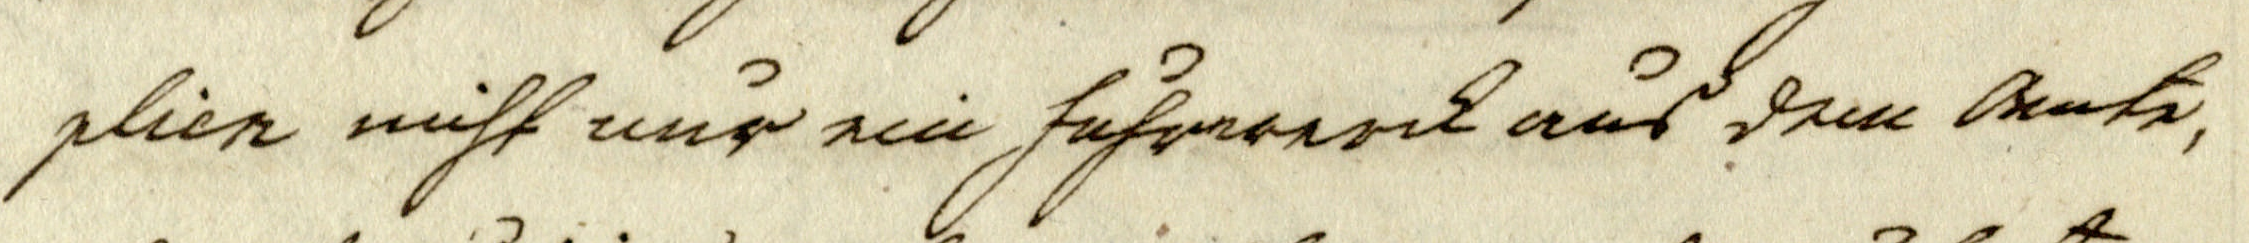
plien nicht nur ein Fuhrwerck aus dem Amte,
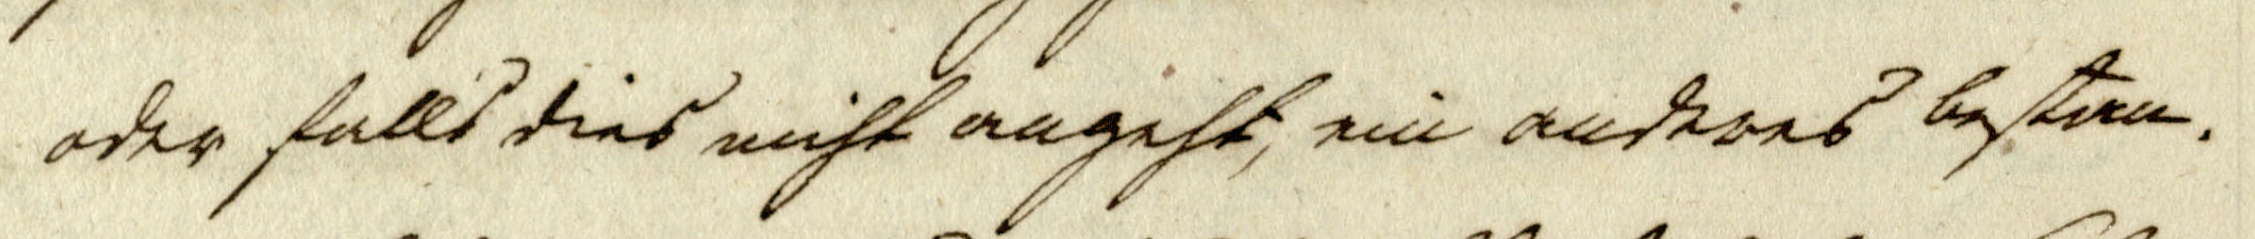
oder falls dies nicht angeht, ein anderes bestan¬
